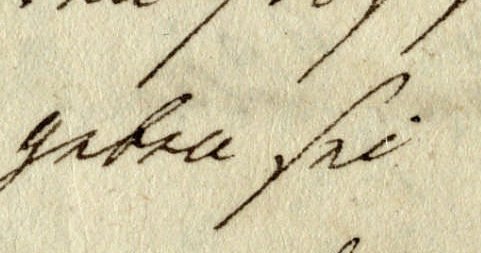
geben sei
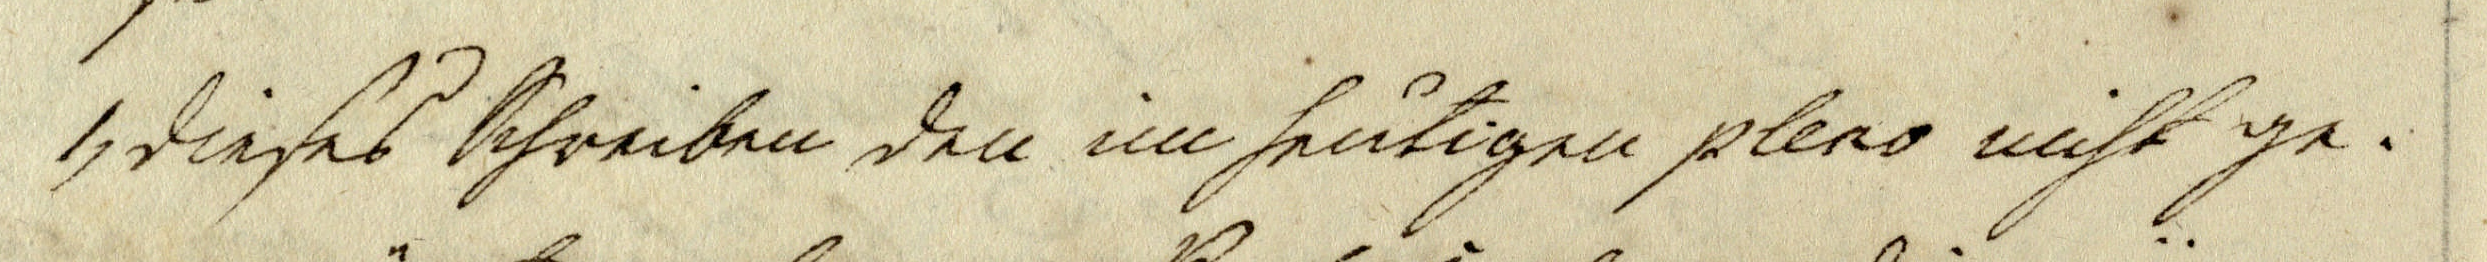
1, dieses Schreiben den im heutigen pleno nicht ge¬
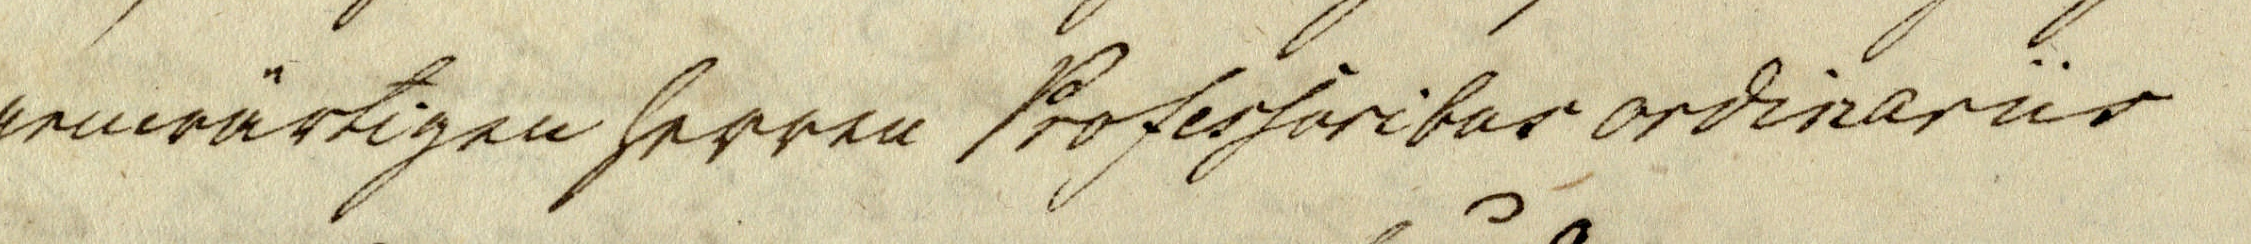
genwärtigen Herren Professoribus ordinariis
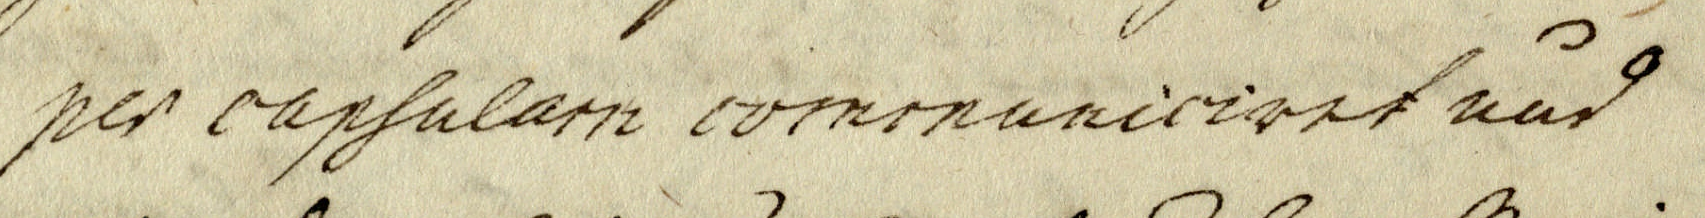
per capsulam communiciret und
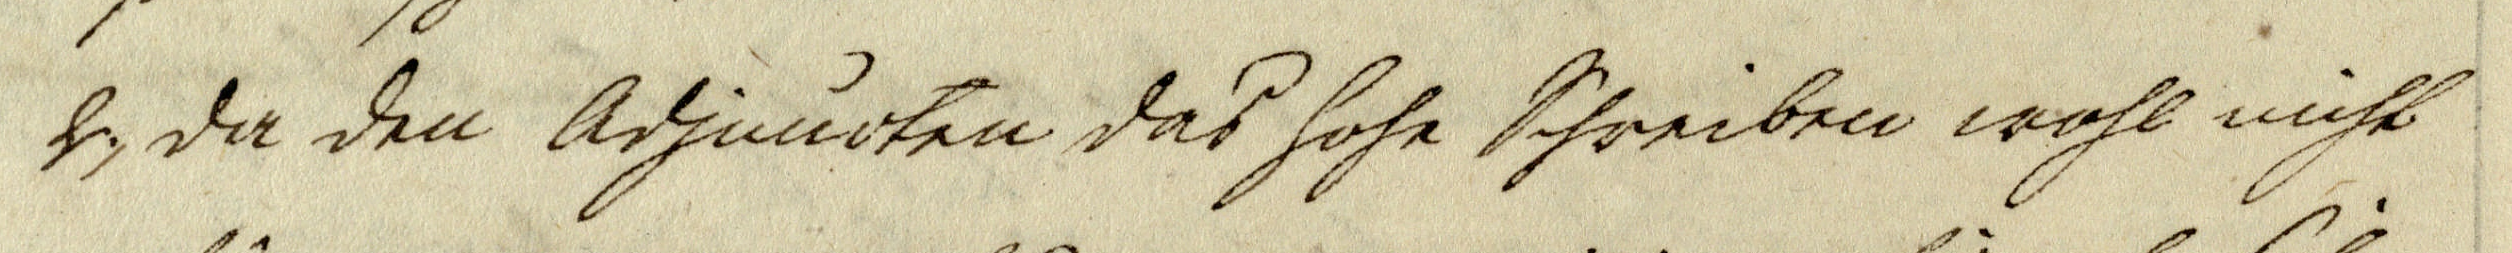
2, da den Adjucten das hohe Schreiben wohl nicht
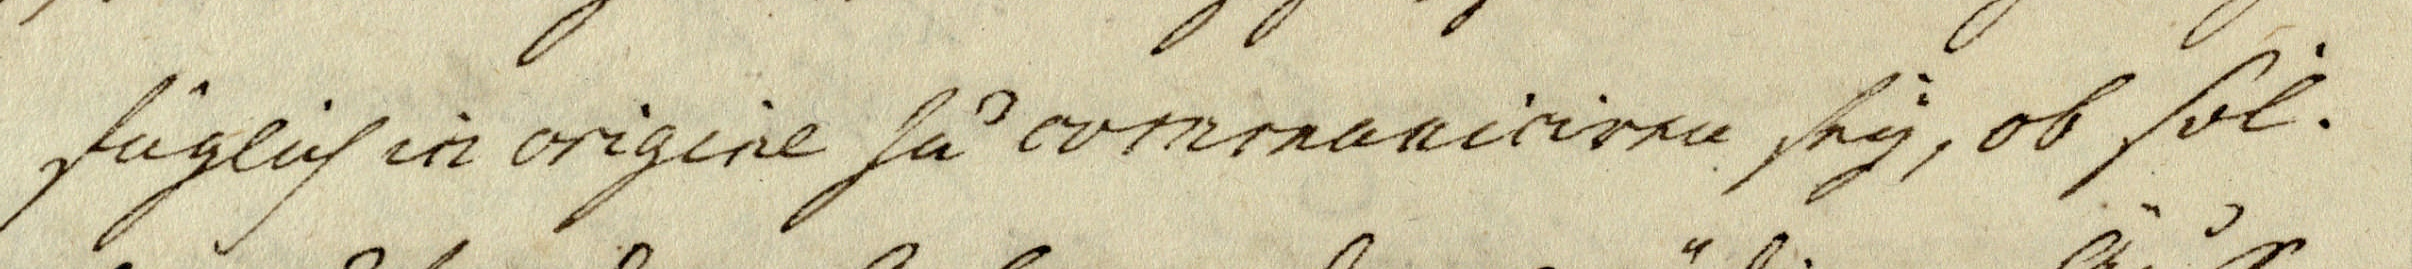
füglich in origine zu communiciren seÿ, ob sol¬
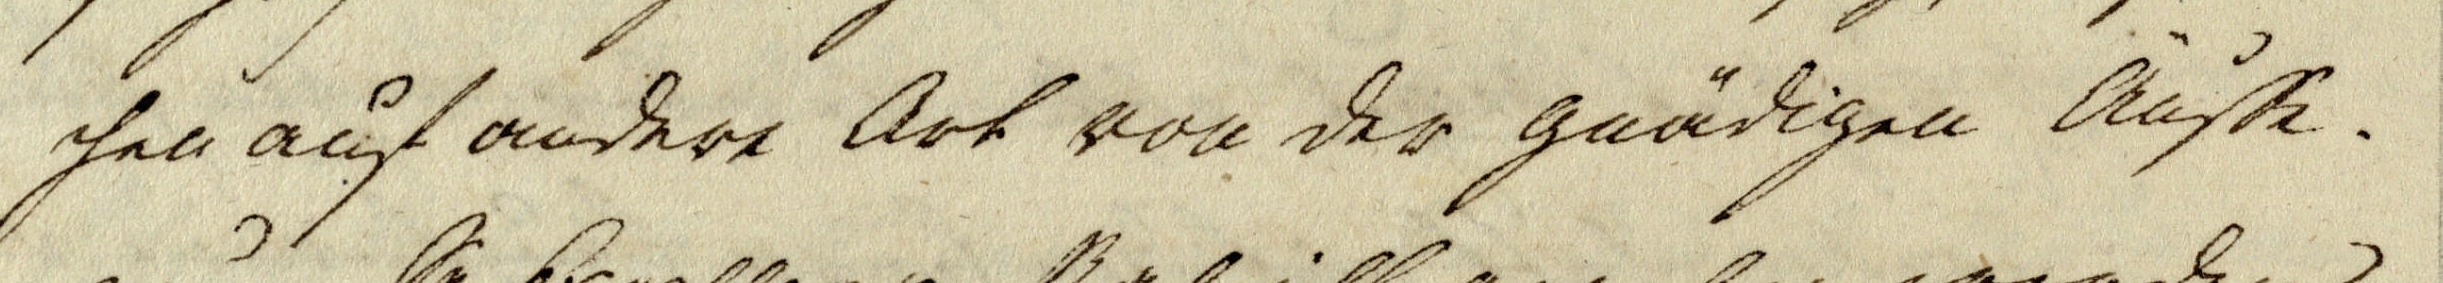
chen auf andere Art von der gnädigen Äusse¬
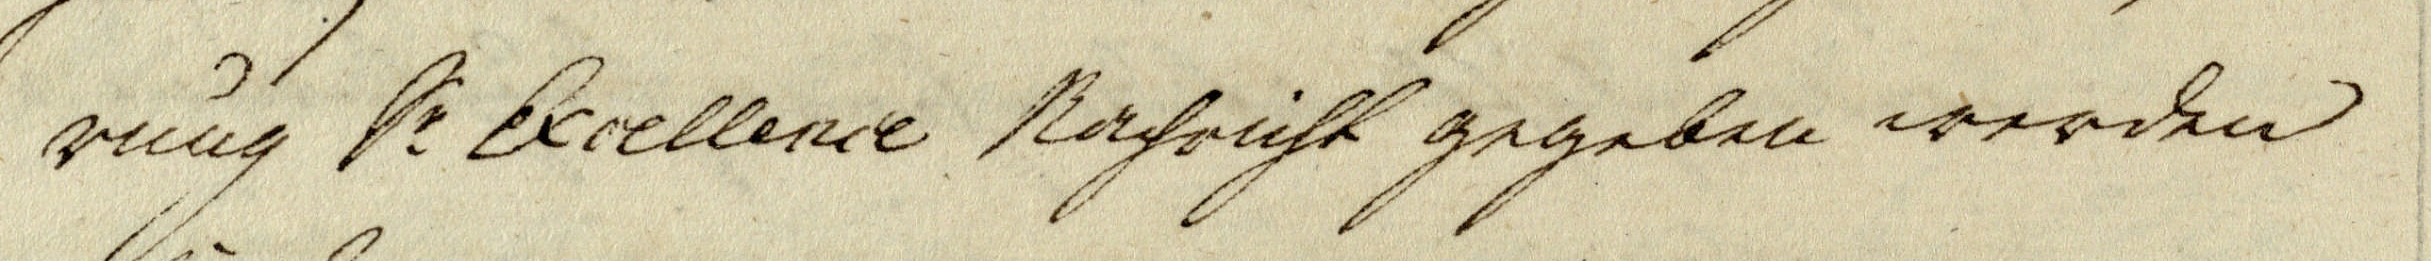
rung Sr Excellence Nachricht gegeben werden
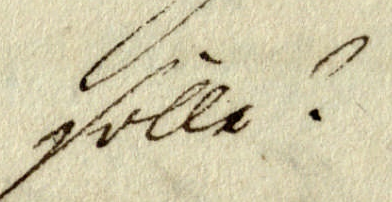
solle?
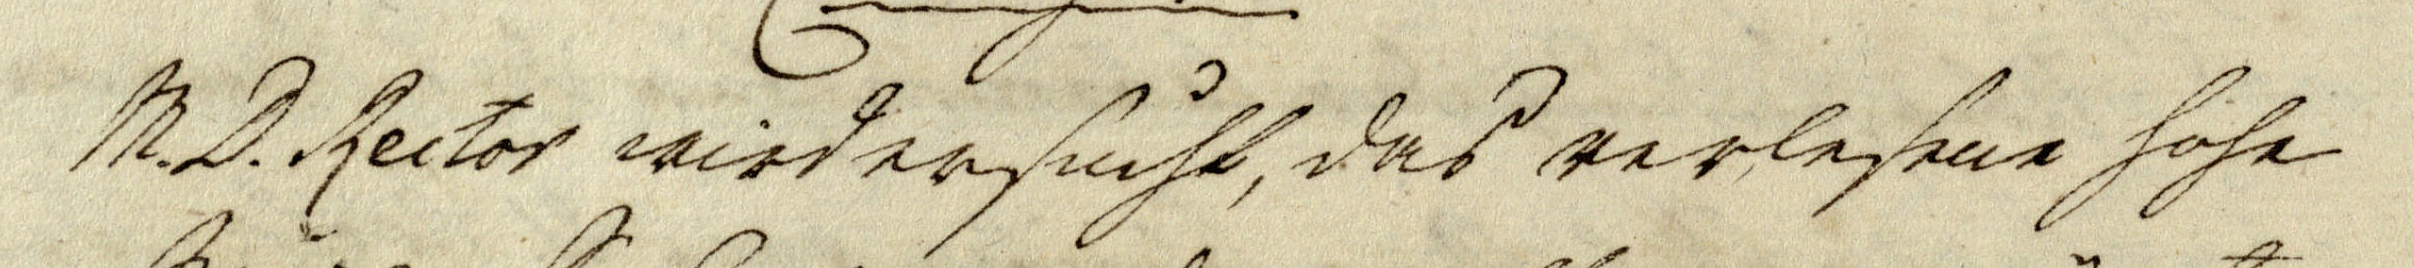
M. D. Rector wird ersucht, das verlesene hohe
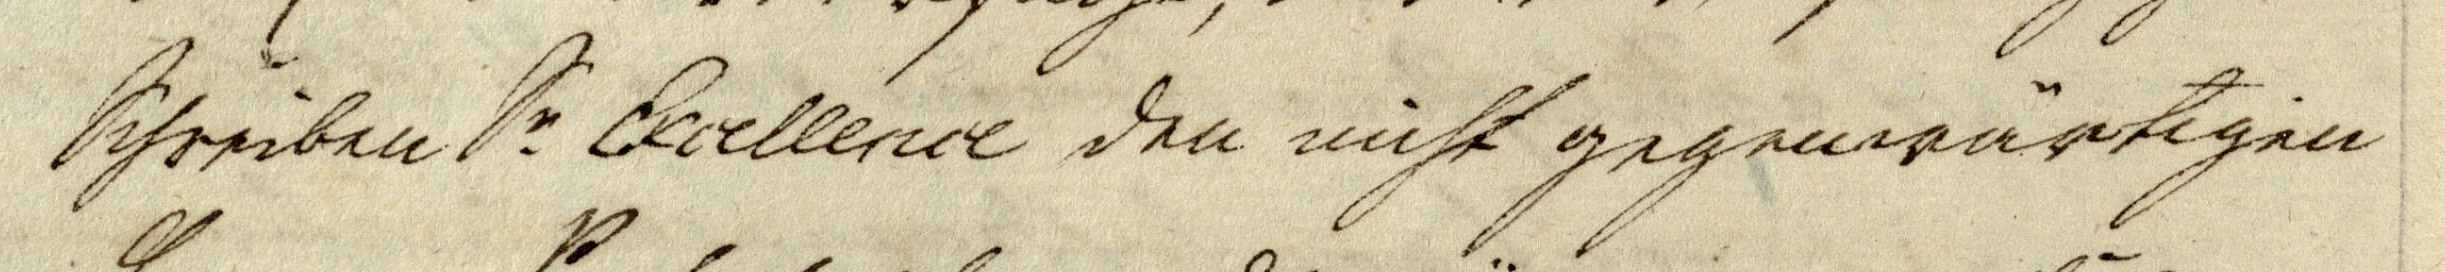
Schreiben Sr Excellence den nicht gegenwärtigen
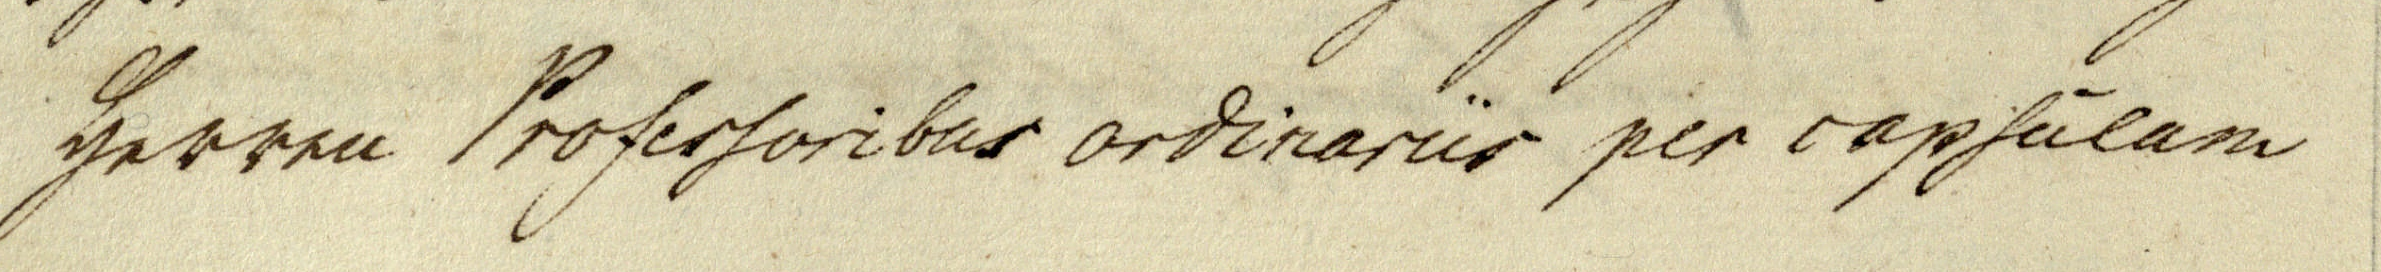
Herren Prosessoribus ordinariis per capsulam
